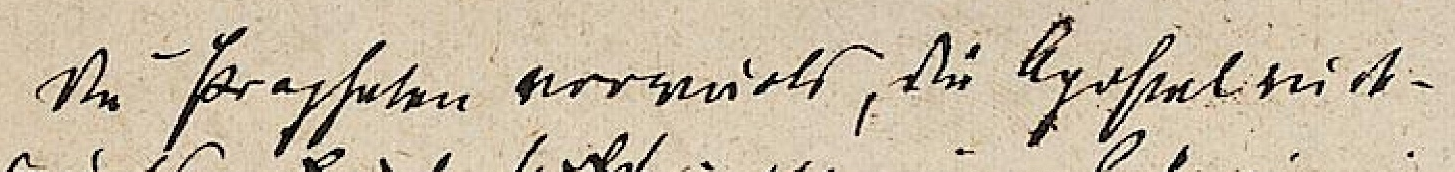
die Propheten vorwärts, die Apostel rück¬
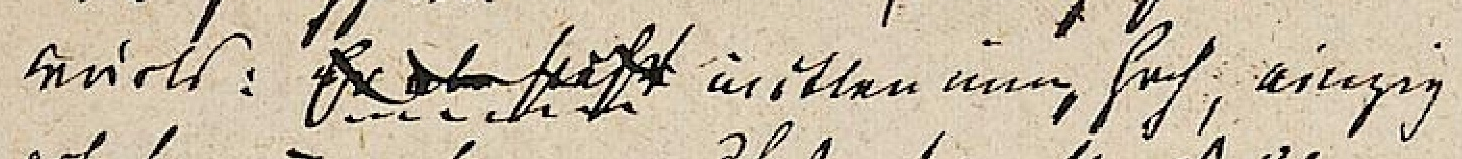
wärts: Er ab steht mitten ein, hoch, einzig
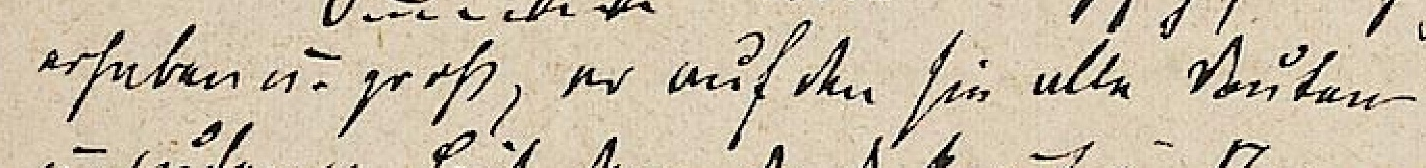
erhaben u. groß, er auf den sie alle deuten
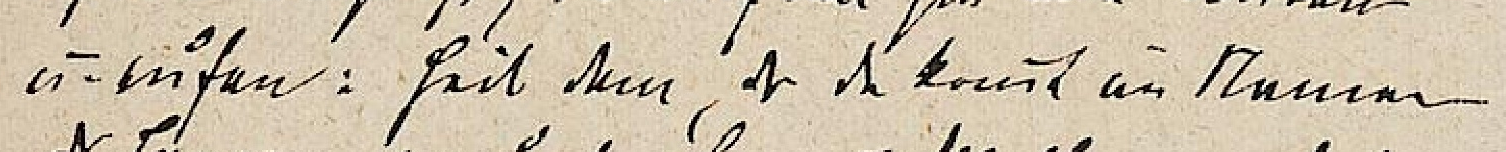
u. rufen: Heil dem, dr da komt im Namen
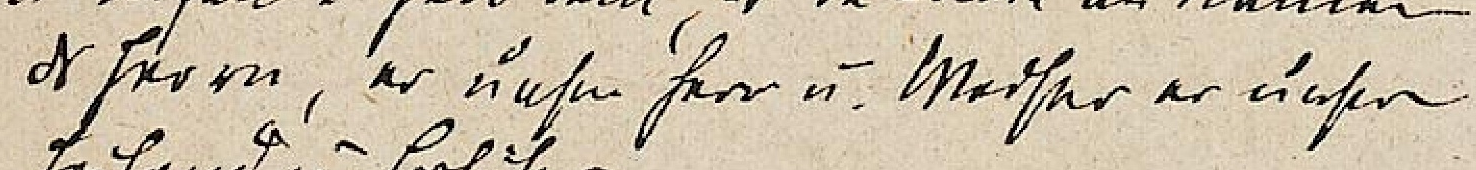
ds Herrn, er unser Herr u Meister er unsr
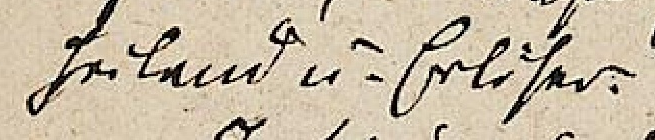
Heiland u. Erlöser.
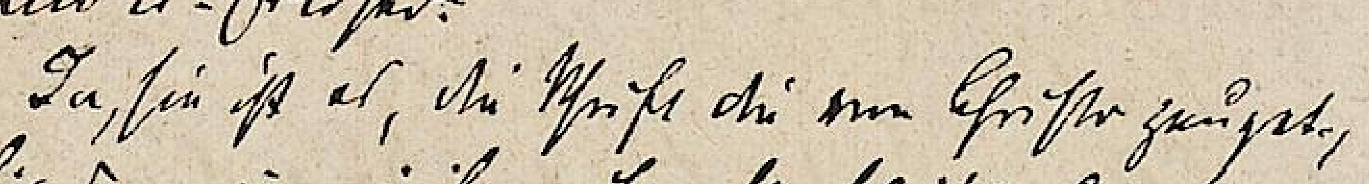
Ja, sie ist es, die Schrif die von Christo zeuget,
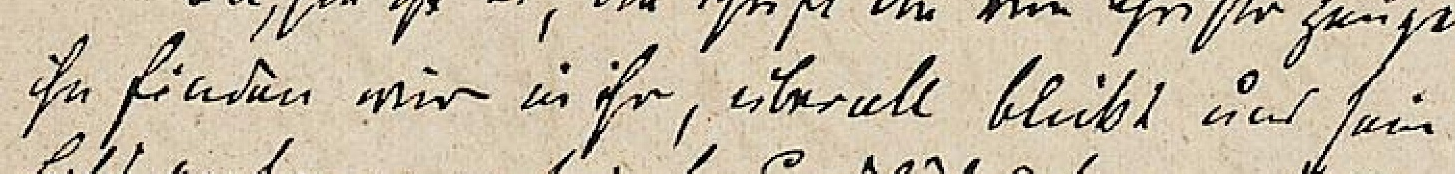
ihn finden wir in ihr, überall blickt uns sein
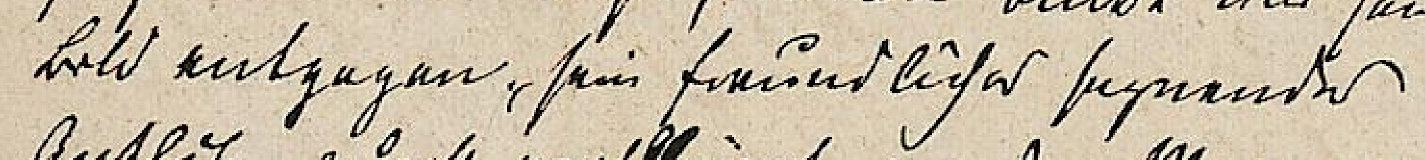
Bild entgegen, sein freundliches segnendes
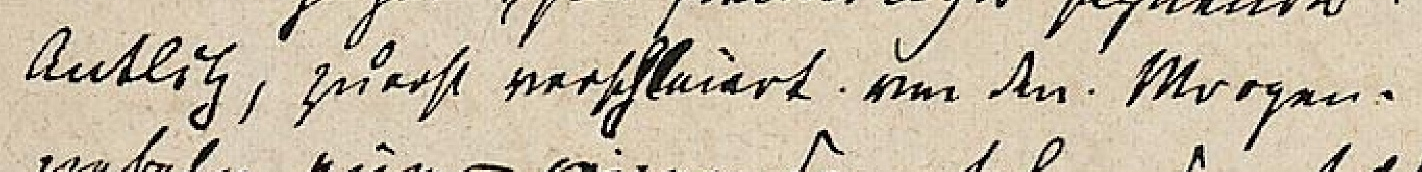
Antlitz, zuerst verschleiert von den Morgen¬
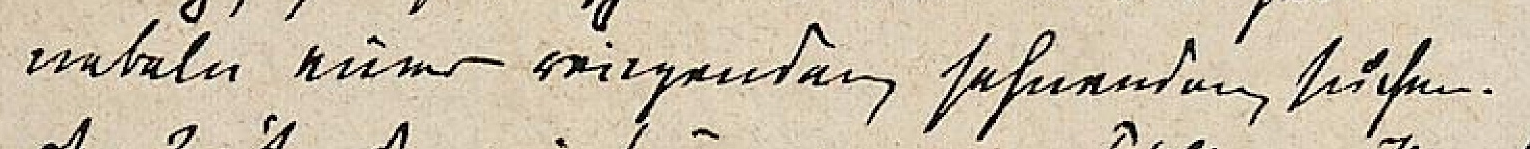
nebeln einer reinzenden, sehnenden, suchen¬
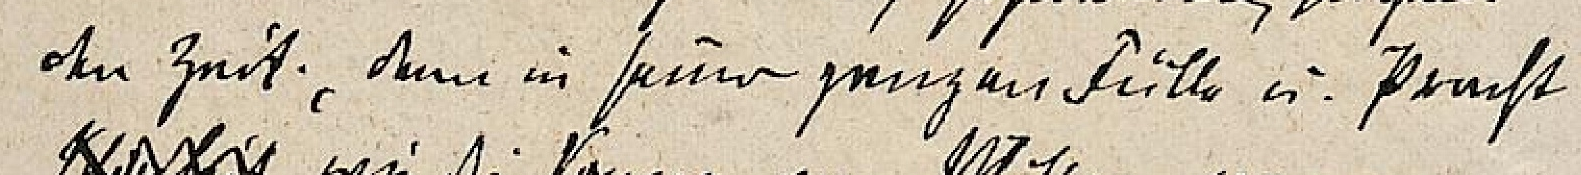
den Zeit, dann in seiner ganzen Fülle u. Pracht
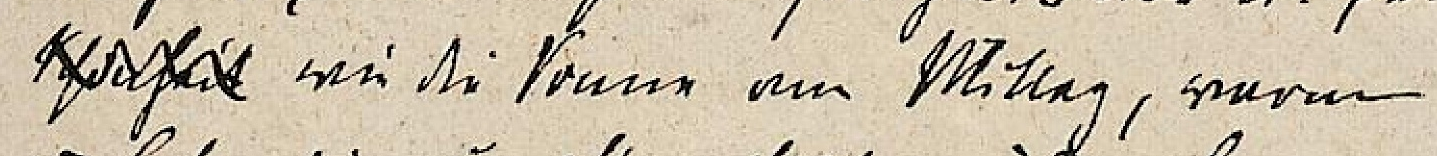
Schönheit, wie die Sonne am Mittag, warm
